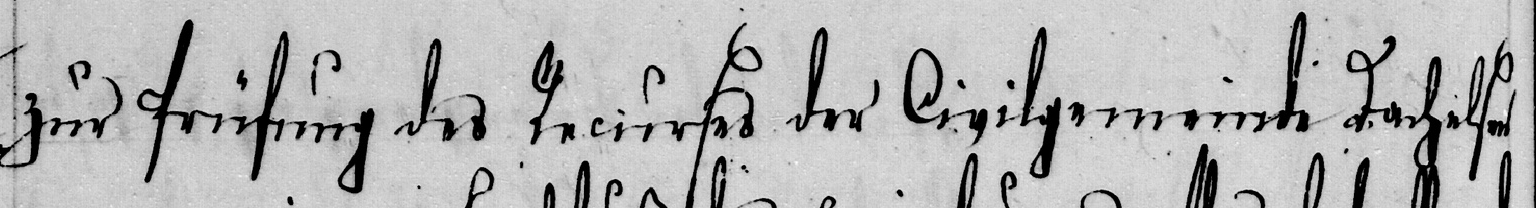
zur Prüfung des Recurses der Civilgemeinde Dachels¬
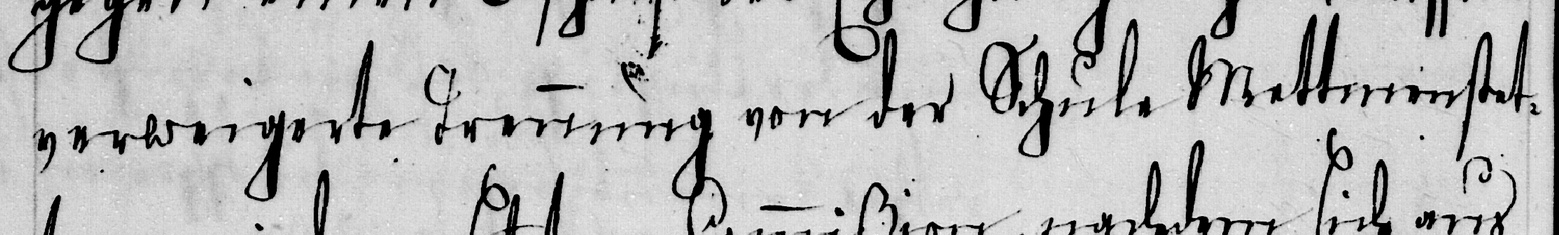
verweigerte Trennung von der Schule Mettmenstet¬
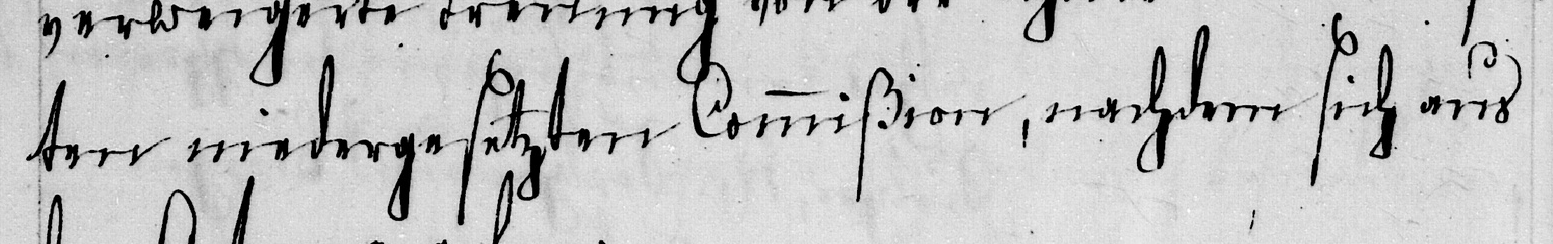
ten niedergesetzten Commißion, nachdem sich aus
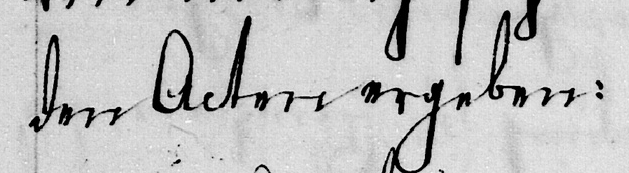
den Acten ergeben:
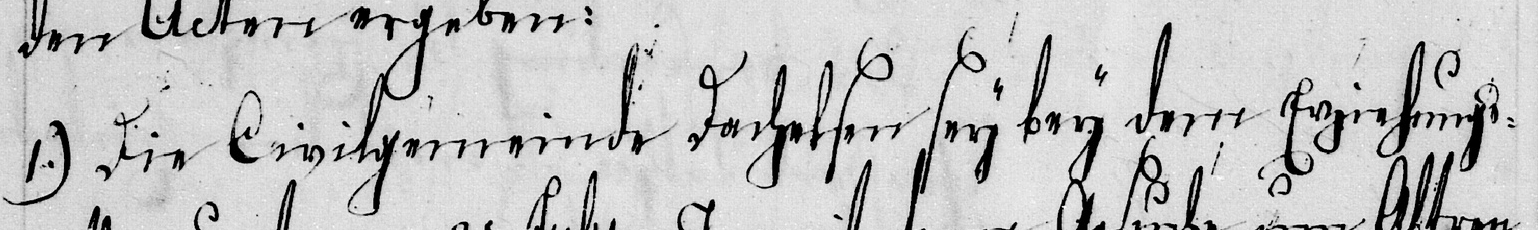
1.) Die Civilgemeinde Dachelsen sey bey dem Erziehung¬
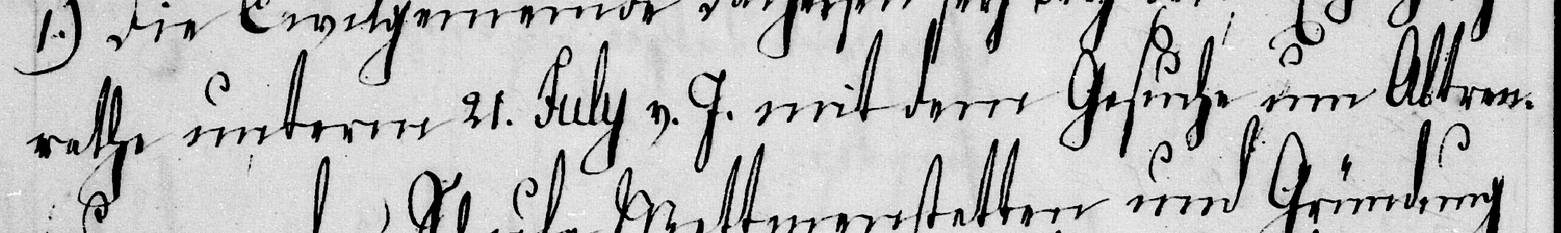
srathe unterm 21. July v. J. mit dem Gesuche um Abtren¬
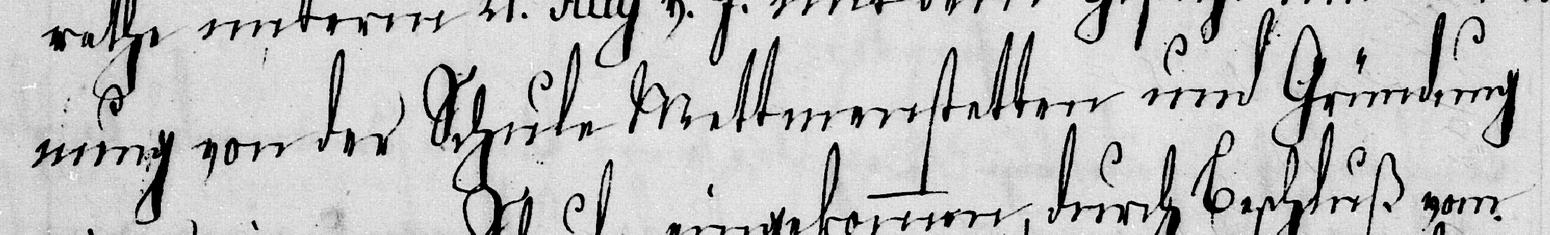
nung von der Schule Mettmenstetten und Gründung
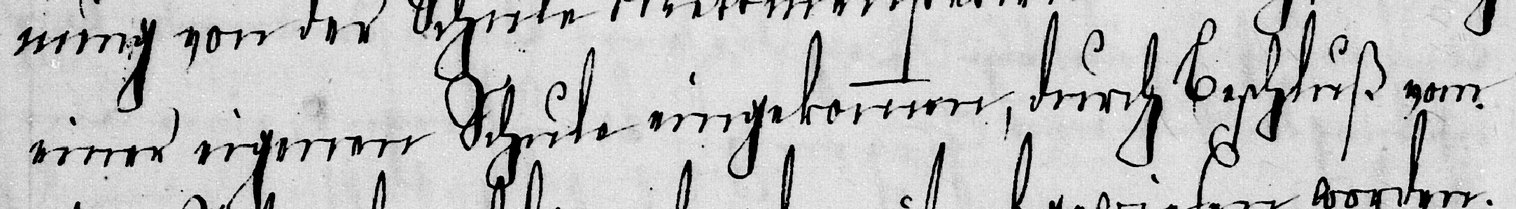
einer eigenen Schule eingekommen, durch Beschluß vom
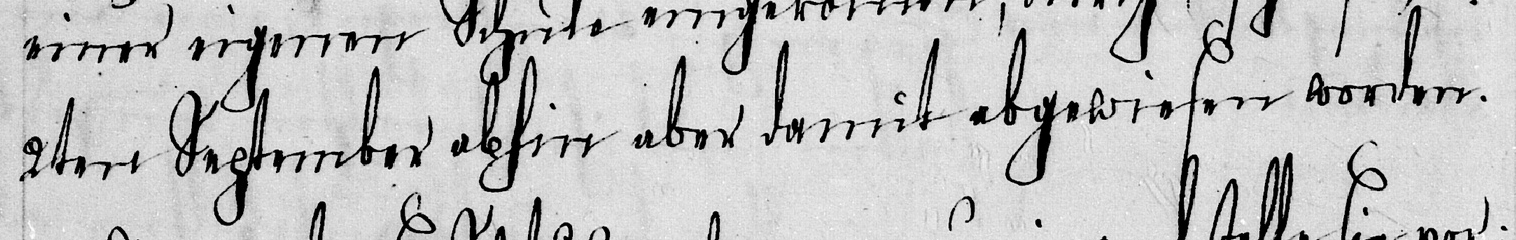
2ten September abhin aber damit abgewiesen worden.
